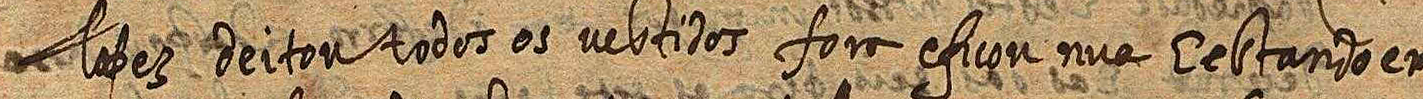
lopez deitou todos os uestidos fora e ficou nua E estando em
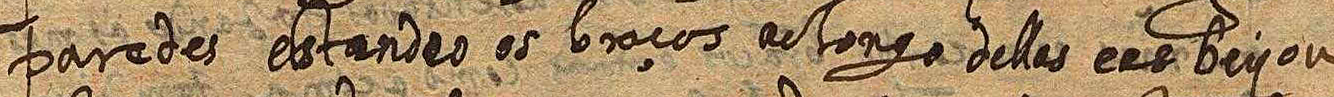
paredes estendeo os braços ao longo dellas e as beijou
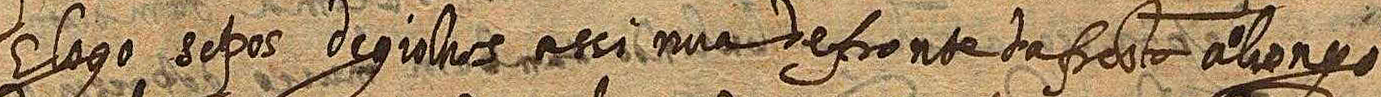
E logo se pos de giolhos assi nua defronte da fresta ao liongo
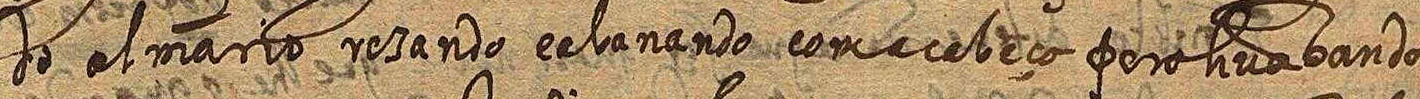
do almario rezando e abanando com a cabeça pera huā banda
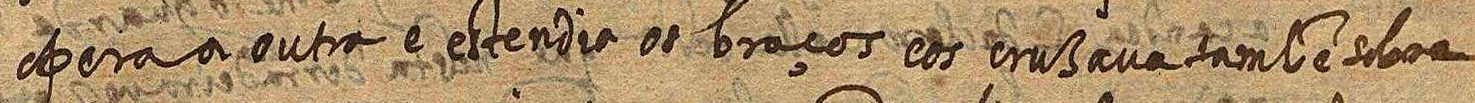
e pera a outra e estendia os braços e os cruzaua tambē sobre
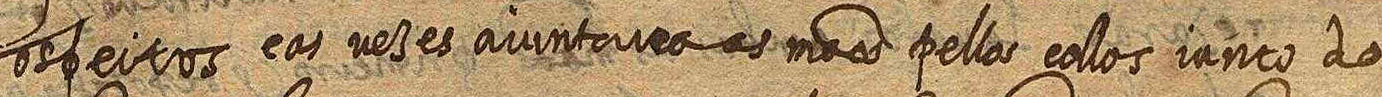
os peitos e as uezes aiuntaua as mãos pellos collos iunto do
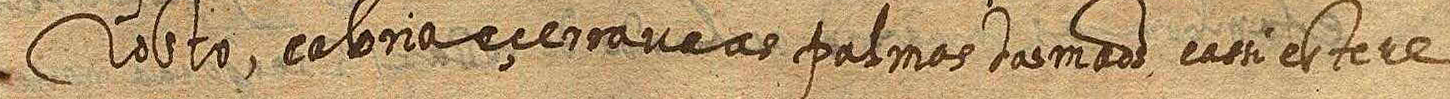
Rosto, e abria e çerraua as palmas das mãos e assi esteue
